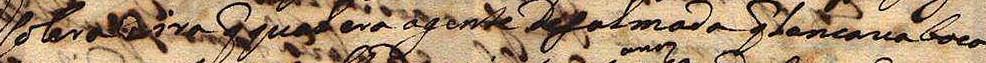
Colera E ira q̄ qual era a gente desalmada q̄ lançaua boca
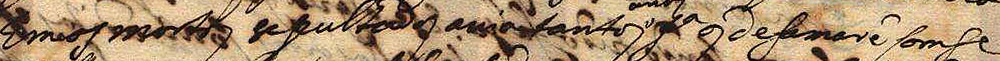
Em os mortos sepultados auia tantos anos pa os defamarē Com se
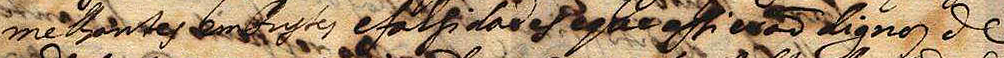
melhantes embustes e falsidades e que assi eraõ dignos de
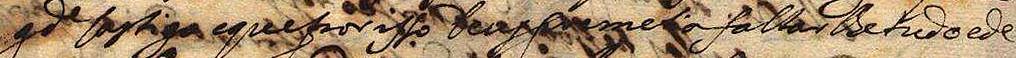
gde Castigo e que por isso deus premeia faltar lhe tudo e de
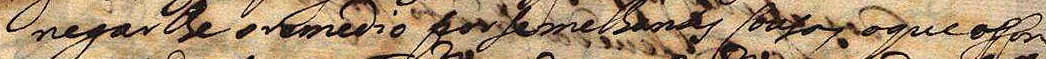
negar lhe o remedio por semelhantes Cousas o que os Con
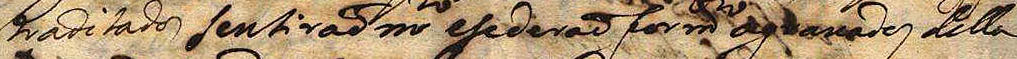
traditados sentirão m.to e se derão por mto agrauados della
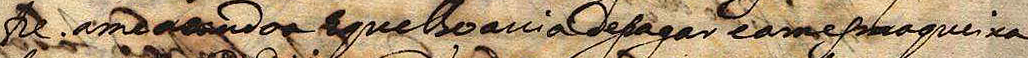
Re ameaçandoa E que lhe auia de pagar e a mesma queixa
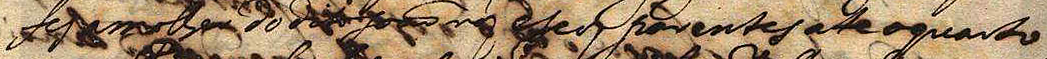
fes a molher do dito Joaõ roz̄ e seos parentes ate o quarto
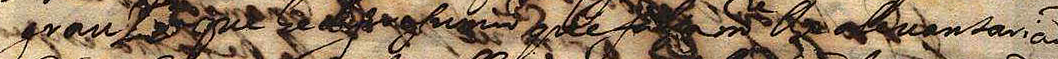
grau Porque he de presumir que falsamte lhe leuantariaõ
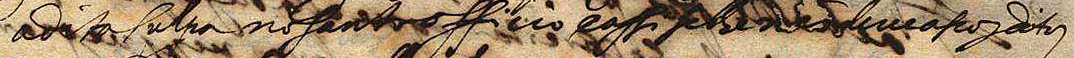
a dita Culpa no santo officio e assi se lhe naõ deue a seos ditos
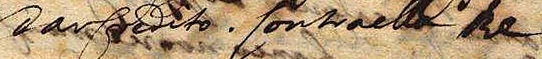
dar Credito. Contra ella Re
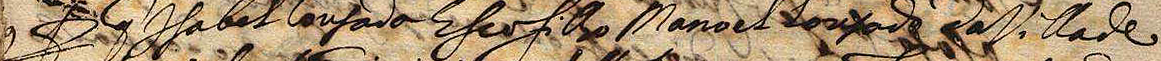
9 Ꝓ q̄ JsabeL lousada E seo filho Manoel Lousado da Villa de
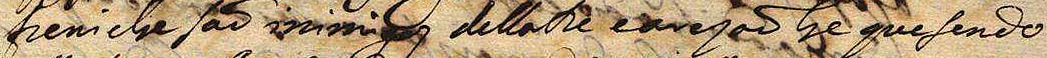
peniche saõ inimigos della Re e a rezaõ he que sendo
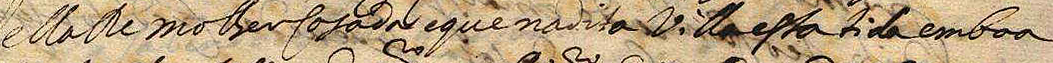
ella Re molher Casada e que na dita Villa esta tida em boa
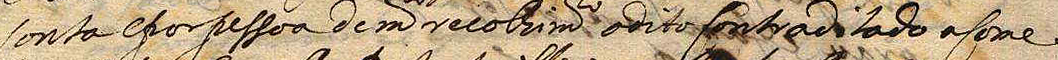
Conta e por pessoa mto recolhimto o dito Contraditado a Come
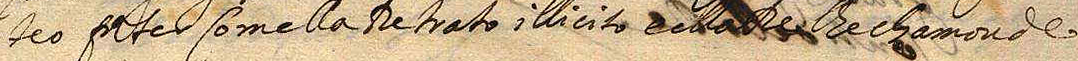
teo pa ter Com ella Re trato illicito e ella Re lhe chamou de
